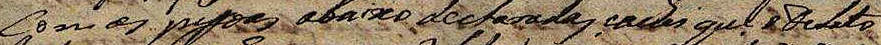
como as pessoas abaixo declaradas, e achei que o Delato
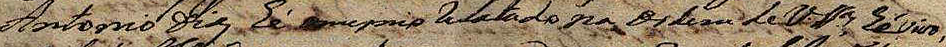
Antonio Dias hé o mesmo Relatado na ordem de V.ss.as hé vivo,
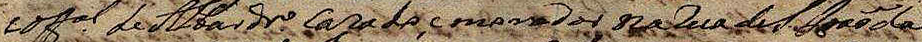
e offa.l de Albardr.o cazado, e morador na Rua de S. Joaõ da
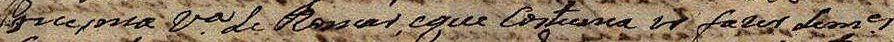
mesma V.a de Thomar, e que costuma ir fazer sem.es
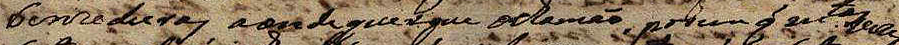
benzeduras, aonde quer que o chamaõ porem q̄ m.tas vezes
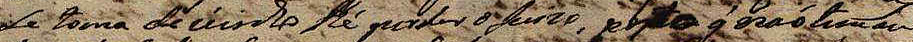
se toma de uinho thé perder o Juizo, posto q̄ naõ tem ou
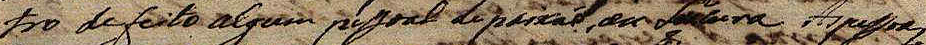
tro defeito algum pessoal de paixaõ, ou Loucura As pessoas
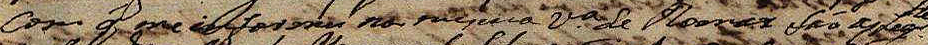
com q̄ me informei na mesma V.a de Thomar saõ as seg.tes
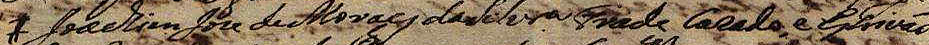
# Joachim Joze de Moraes da Silvr.a Frade Cazado, e Escrivão
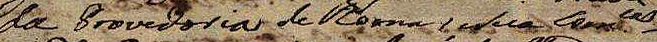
da Provedoria de Thomar, e sua comca.
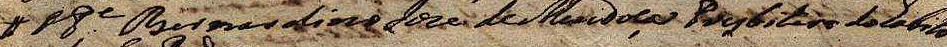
# o P.e Bernardino Iozé de Mendoça Presbitero do habito
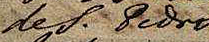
de S. Pedro
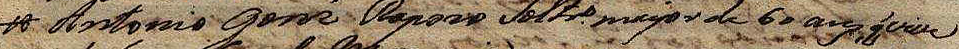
# Antonio Gonz̄ Rapozo soltr.o mayor de 60 ans, q̄ vive
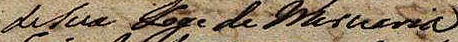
de sua Loge de Mercearia
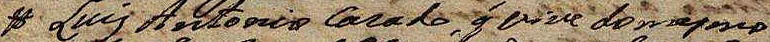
# Luis Antonio cazado, q̄ vive do mesmo
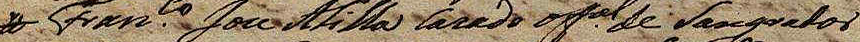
# Fran.co Joze Avilla cazado off.al de Sangrador
